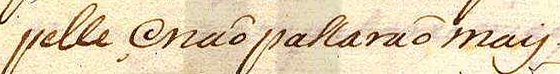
pelle, e naõ passaraõ mais
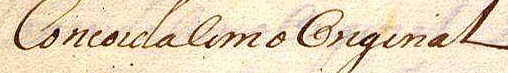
Concorda Com o OriginaL
